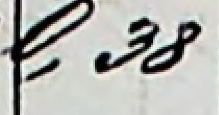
0,38
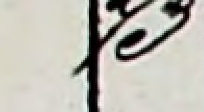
73
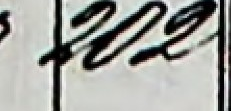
202
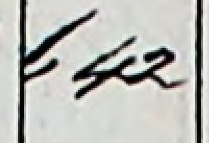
1,42
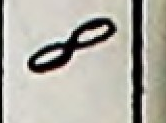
8
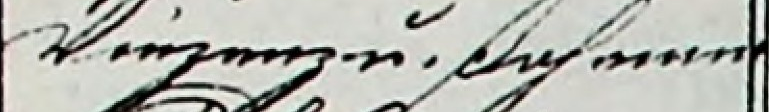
Vinzenz u. Johanna
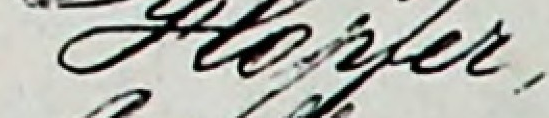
Hopfer,
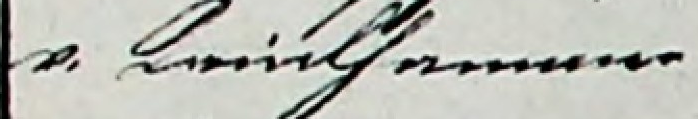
v. Kainlhammer
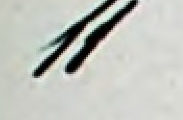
11
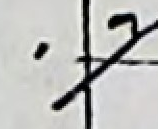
7
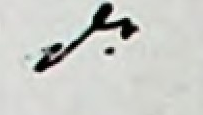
do
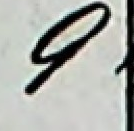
9
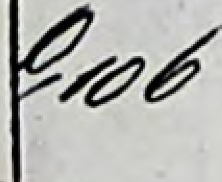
0,106
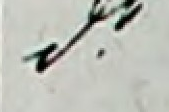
do
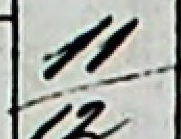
11/12
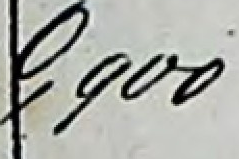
0,900
